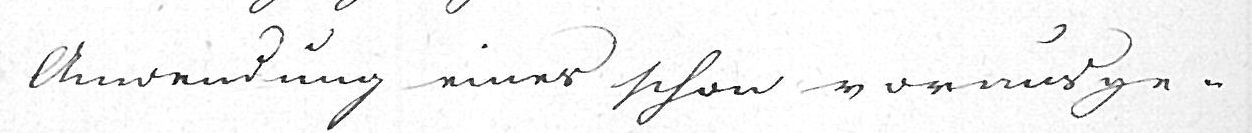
Anwendung eines schon vorausge-
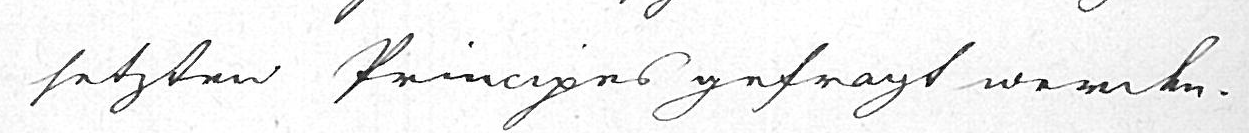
setzten Princips gefragt werden.
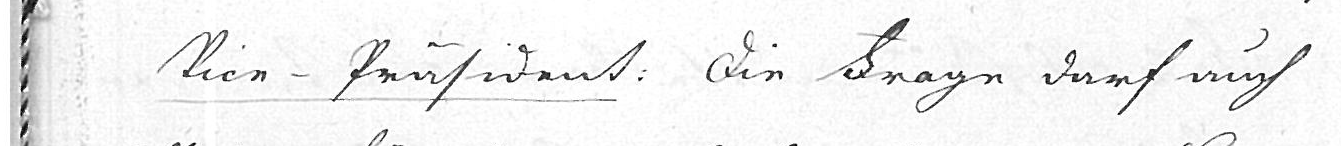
Vice-Präsident: Die Frage darf auch
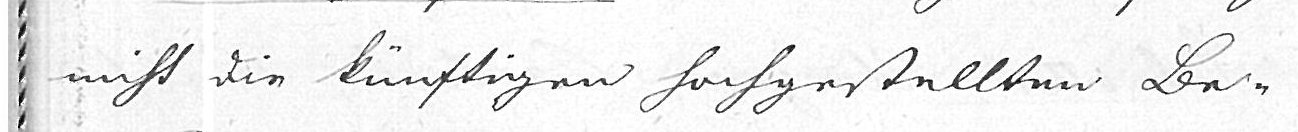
nicht die künftigen hochgestellten Be-
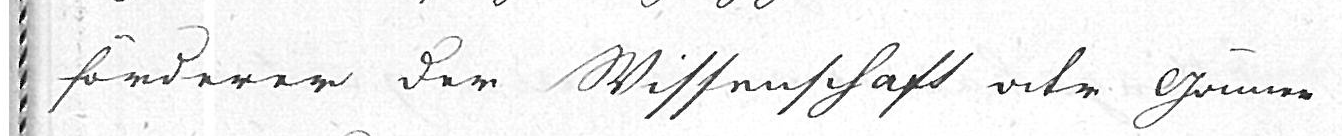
förderer der Wissenschaften oder Gönner
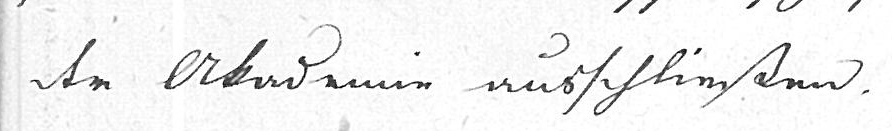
der Akademie ausschießen.
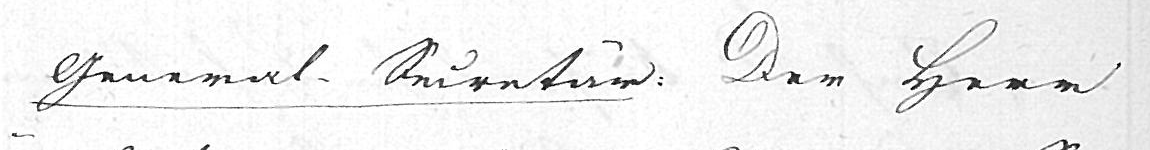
General-Secretär: Der Herr
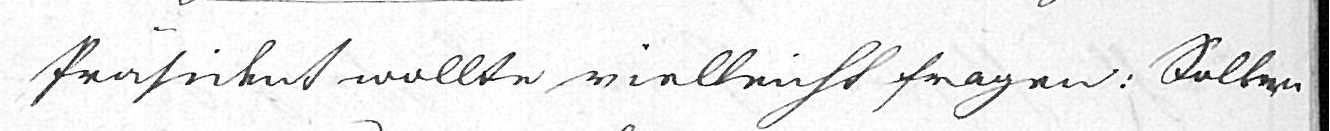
Präsident wollte vielleicht fragen: Sollten
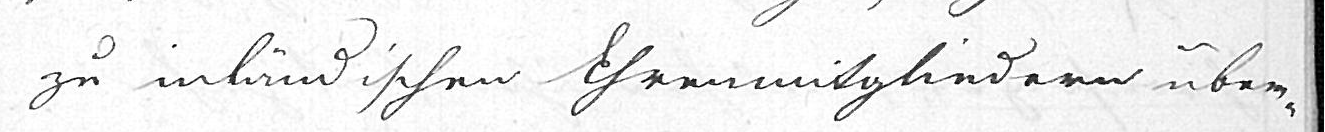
zu inländischen Ehrenmitgliedern über-
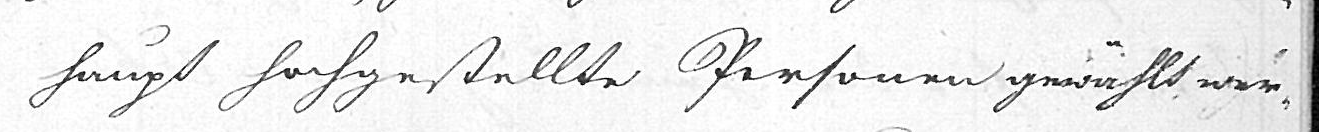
haupt hochgestellte Personen gewählt wer-
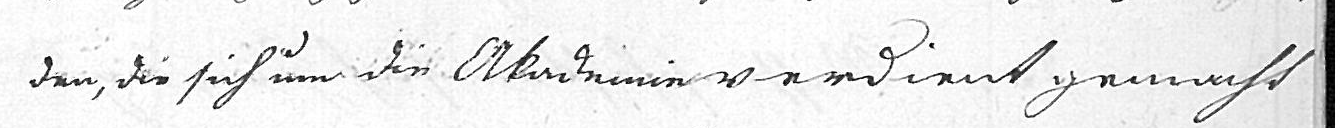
den, die sich um die Akademie verdient gemacht
